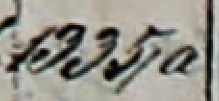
1335/a
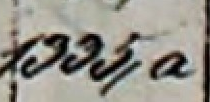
1335/a
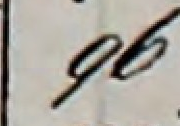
96
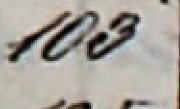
103
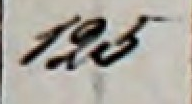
125
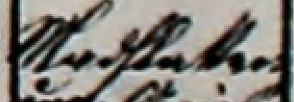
Madstakkers
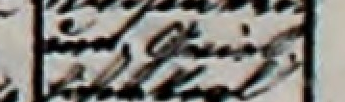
um Gries
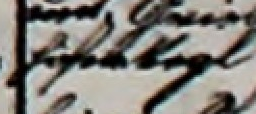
???kogl
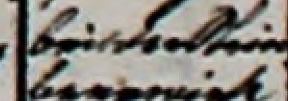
bei der Stein„
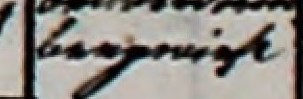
bergwiese
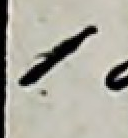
1
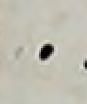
„
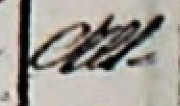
Alt„
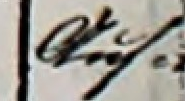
Auf„
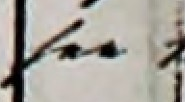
see
